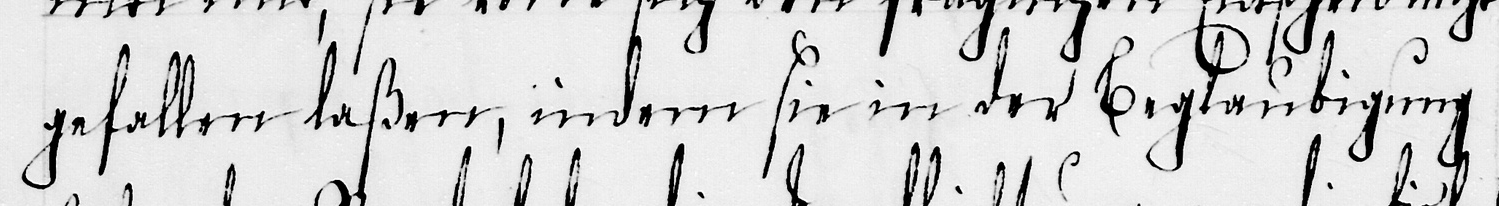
gefallen laßen, indem sie in der Beglaubigung
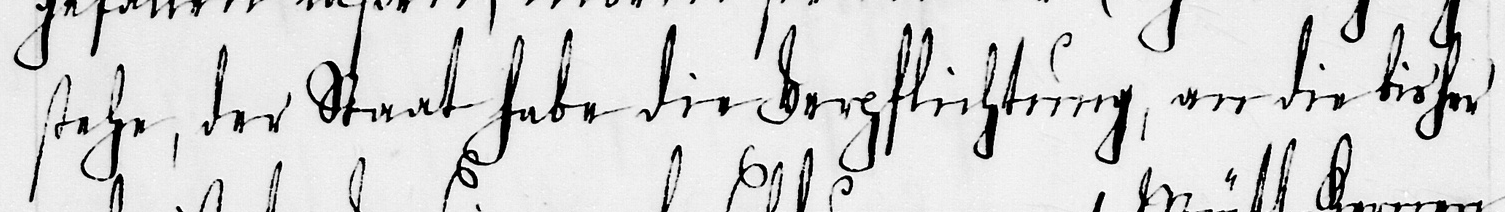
stehe, der Staat habe die Verpflichtung, an die bish¬
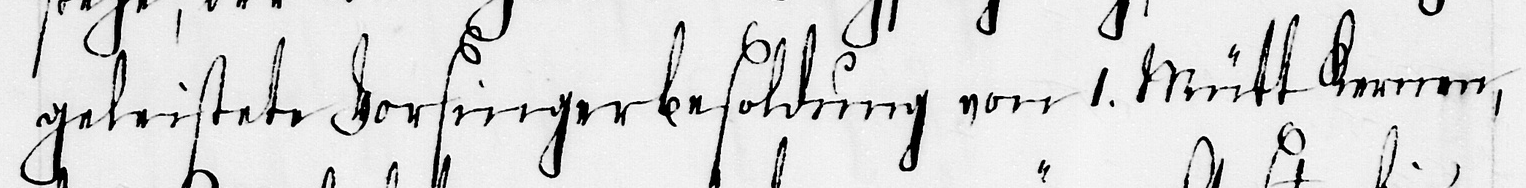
geleistete Vorsingerbesoldung von 1. Mütt Kernen,
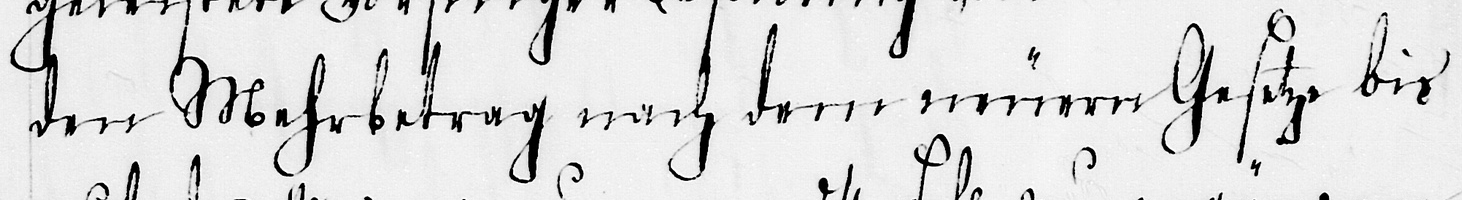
den Mehrbetrag nach dem neuern Gesetze bis
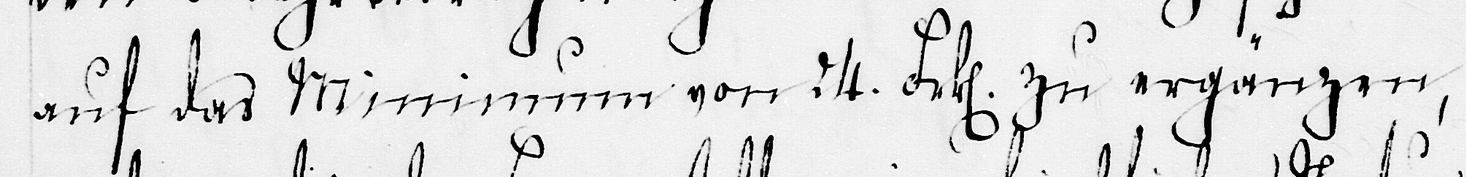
auf das Minimun von 24. Frk[en]. zu ergänzen,
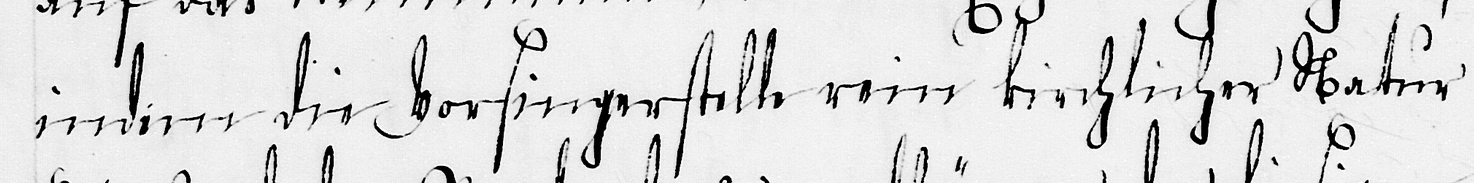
indem die Vorsingerstelle rein kirchlicher Natur
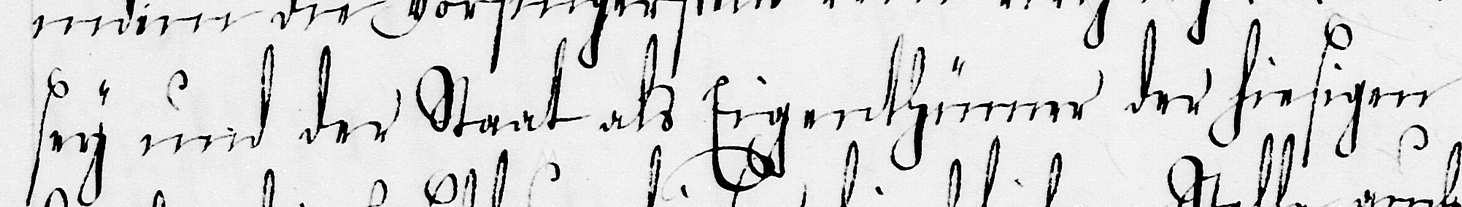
sey und der Staat als Eigenthümer der hiesigen
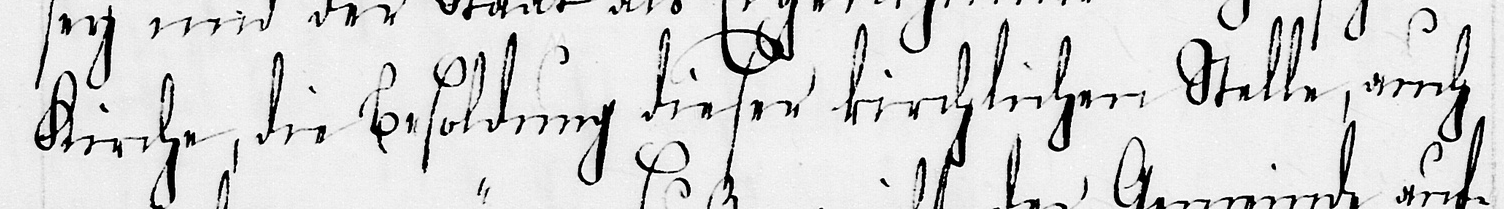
Kirche, die Besoldung dieser kirchlichen Stelle, auch
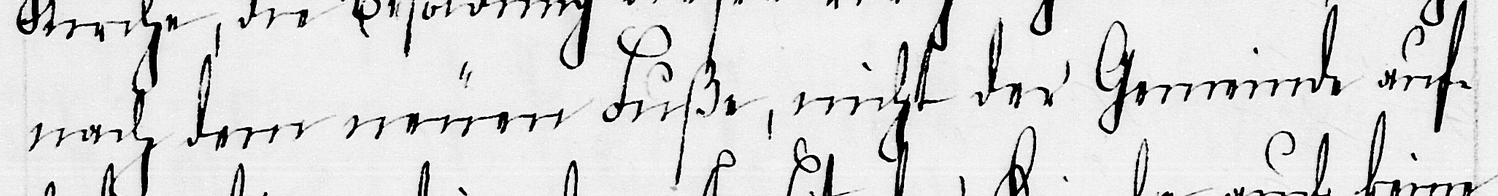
nach dem neuen Fuße, nicht der Gemeinde auf¬
